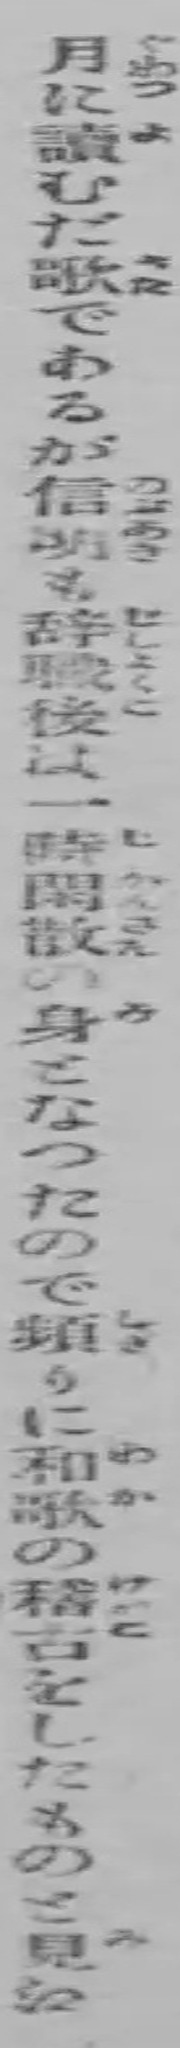月に読むだ歌であるが信明も辞職後は一時閑散の身となつたので頻りに和歌の稽古をしたものと見え
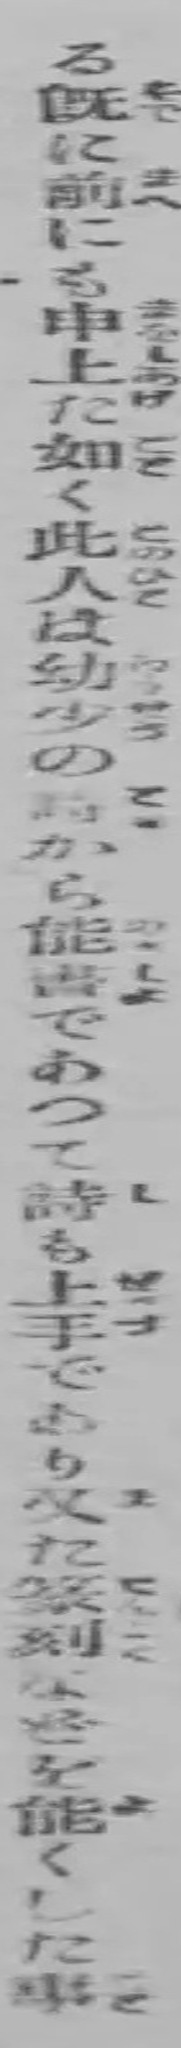る既に前にも申上た如く此人は幼少の時から能書であつて詩も上手であり又た篆刻などを能くした事
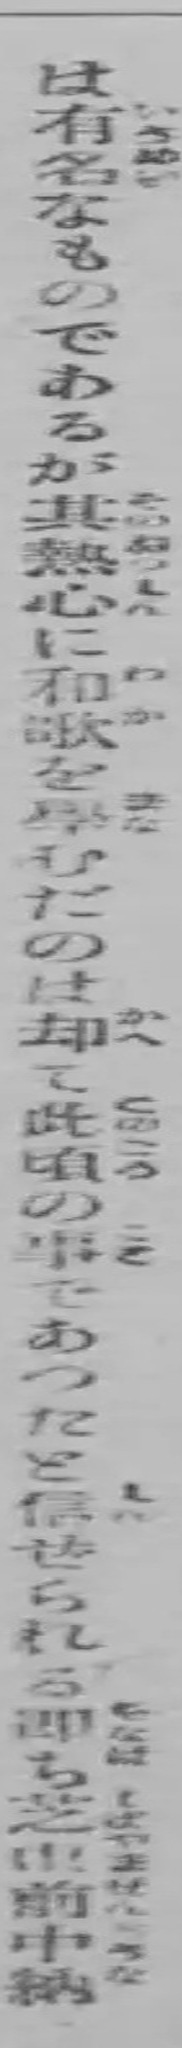は有名なものであるが其熱心に和歌を学むだのは却て此頃の事であつたと信ぜられる即ち芝山前中納
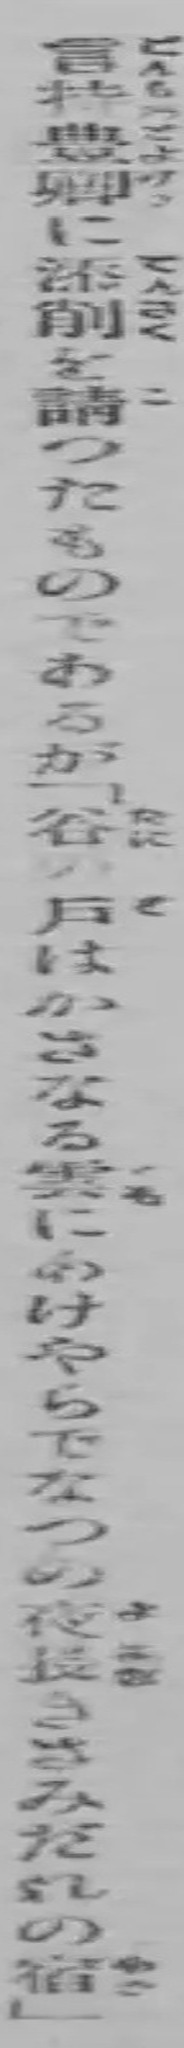言持豊卿に添削を請つたものであるが「谷の戸はかさなる雲にあけやらでなつの夜長きさみだれの宿」

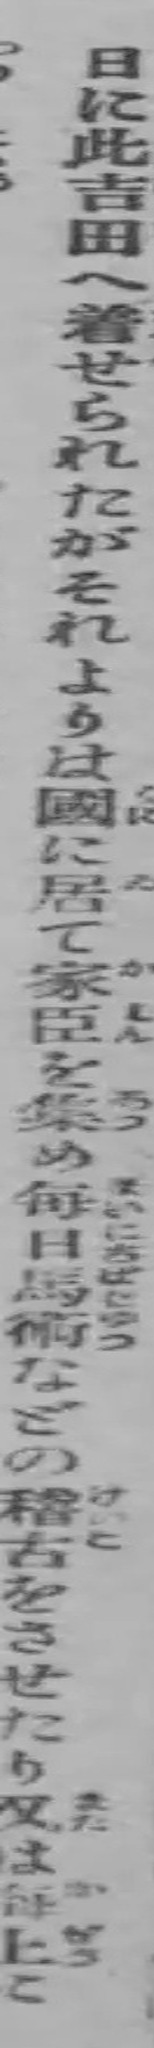日に此吉田へ着せられたがそれよりは国に居て家臣を集め毎日馬術などの稽古をさせたり又は海上に
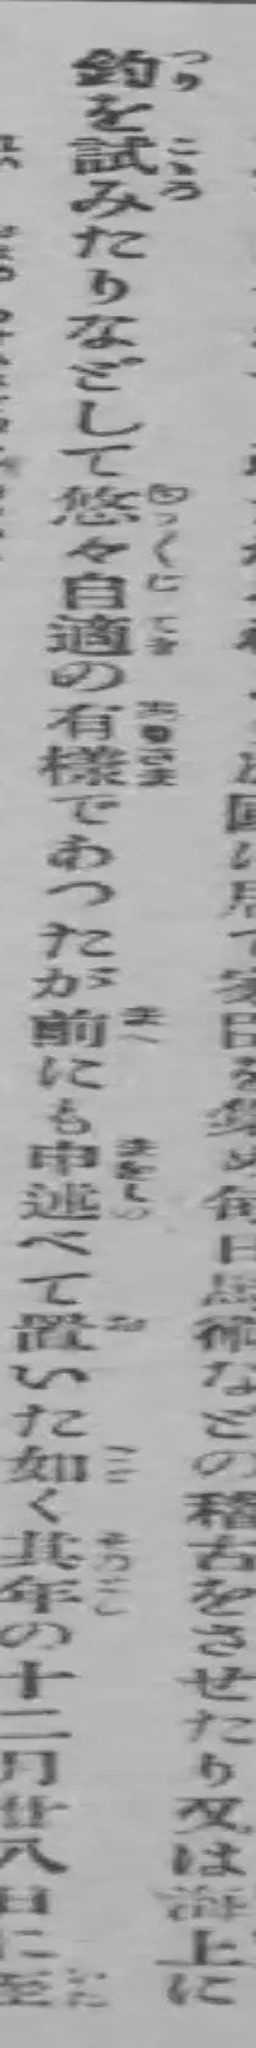釣を試みたりなどして悠々自適の有様であつたが前にも申述べて置いた如く其年の十二月廿八日に至
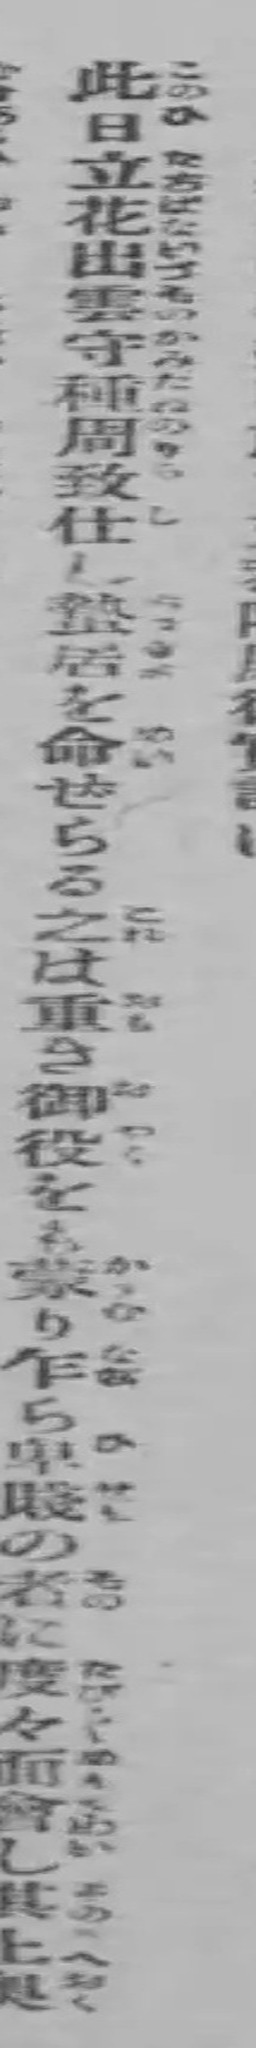此日立花出雲守種周致仕し蟄居を命ぜらる之は重き御役をも蒙り乍ら卑賎の者に度々面会し其上奥
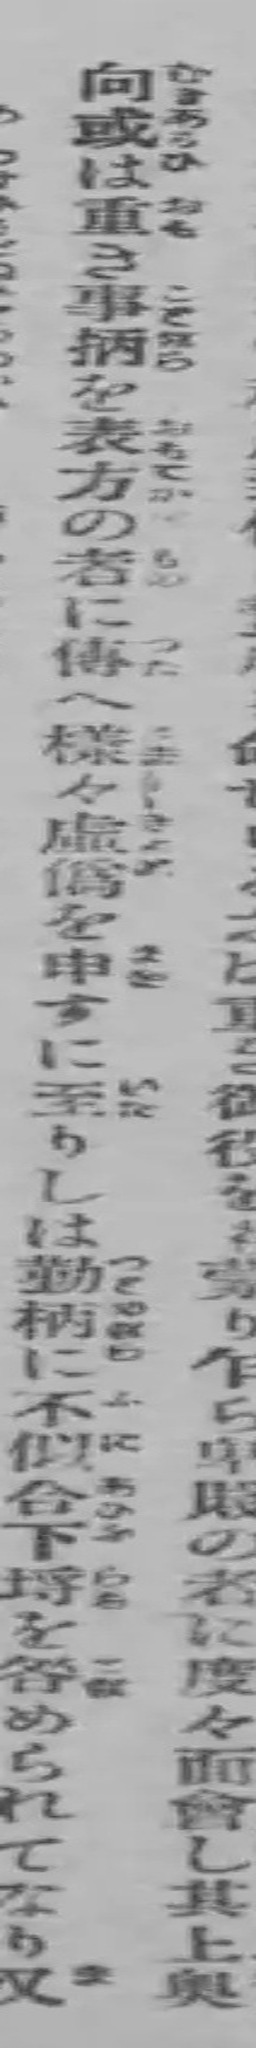向或は重き事柄を表方の者に伝へ様々虚偽を申すに至りしは勤柄に不似合不埒を咎められてなり又
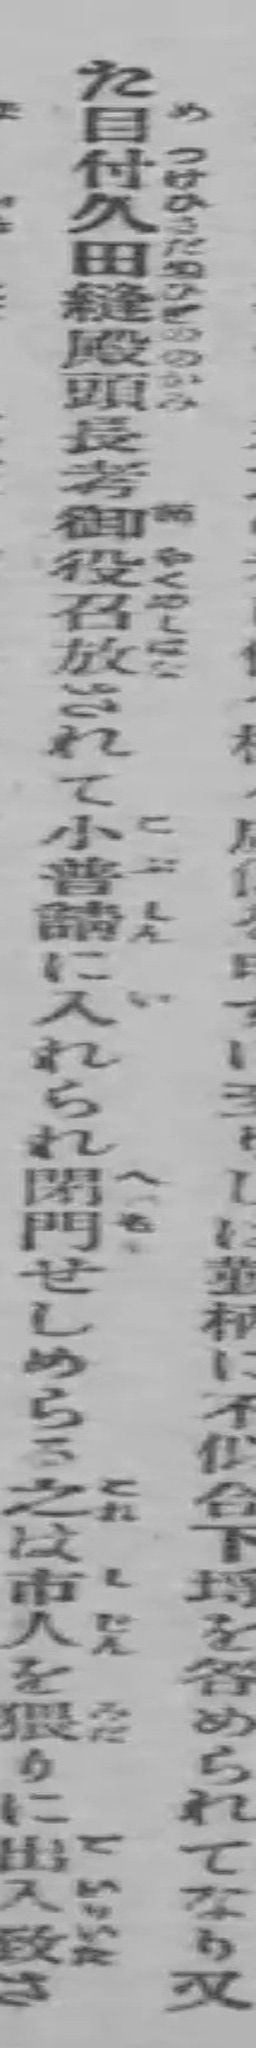た目付久田縫殿頭長考御役召放されて小普請に入れられ閉門せしめらる之は市人を猥りに出入致さ
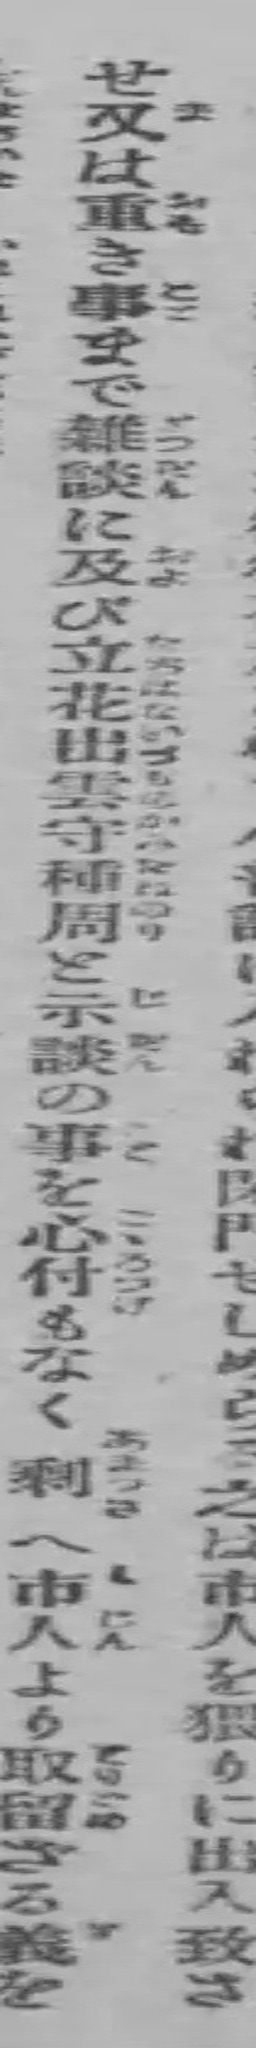せ又は重き事まで雑談に及び立花出雲守種周と示談の事を心付もなく剰へ市人より取留ざる義を
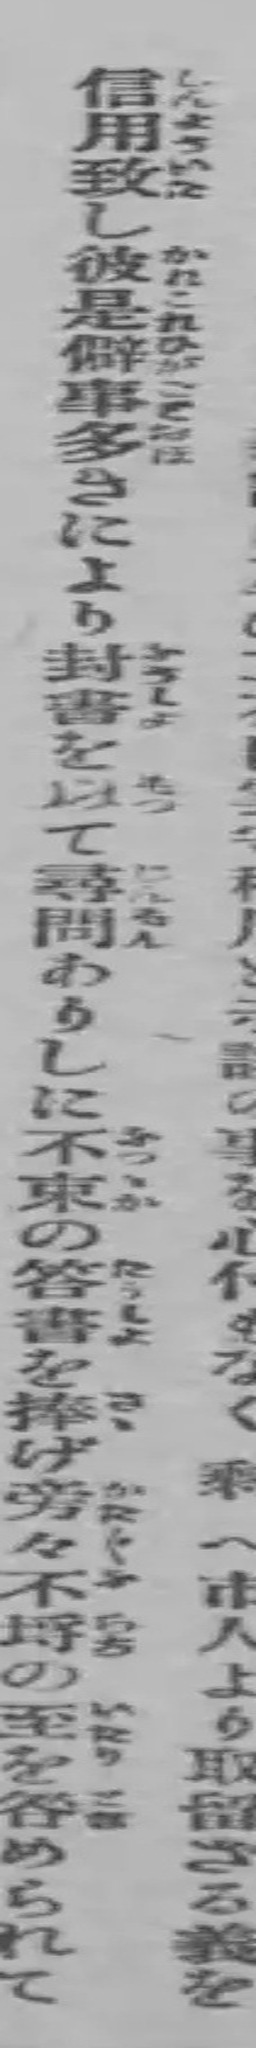信用致し彼是僻事多きにより封書を以て尋問ありしに不束の答書を捧げ旁々不埒の至を咎められて
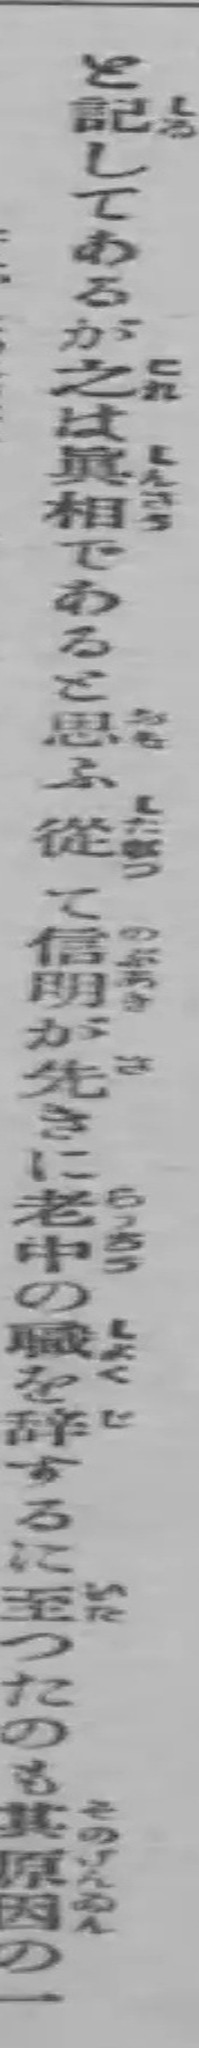と記してあるが之は真相であると思ふ従て信明が先きに老中の職を辞するに至つたのも其原因の一
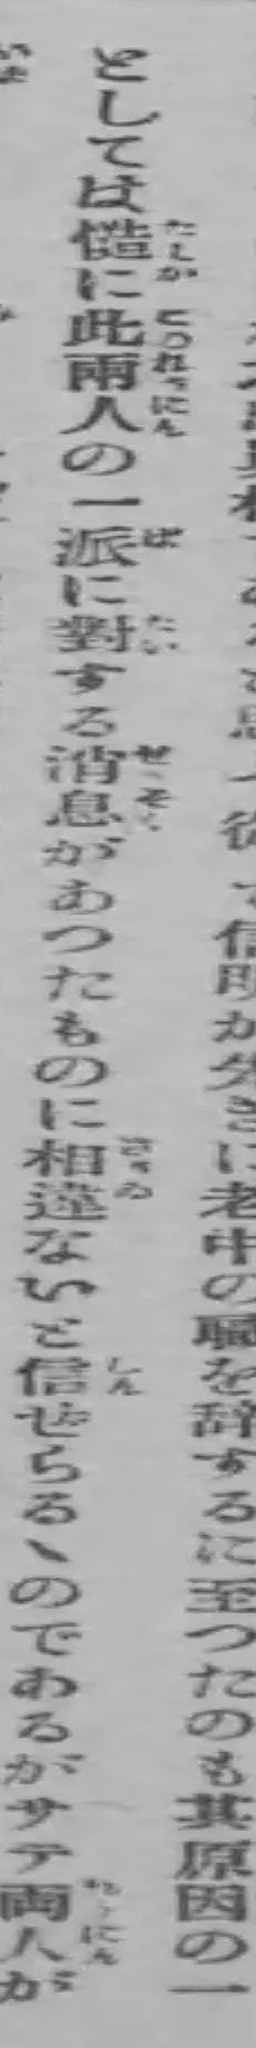としては慥に此両人の一派に対する消息があつたものに相違ないと信ぜらるゝのであるがサテ両人が
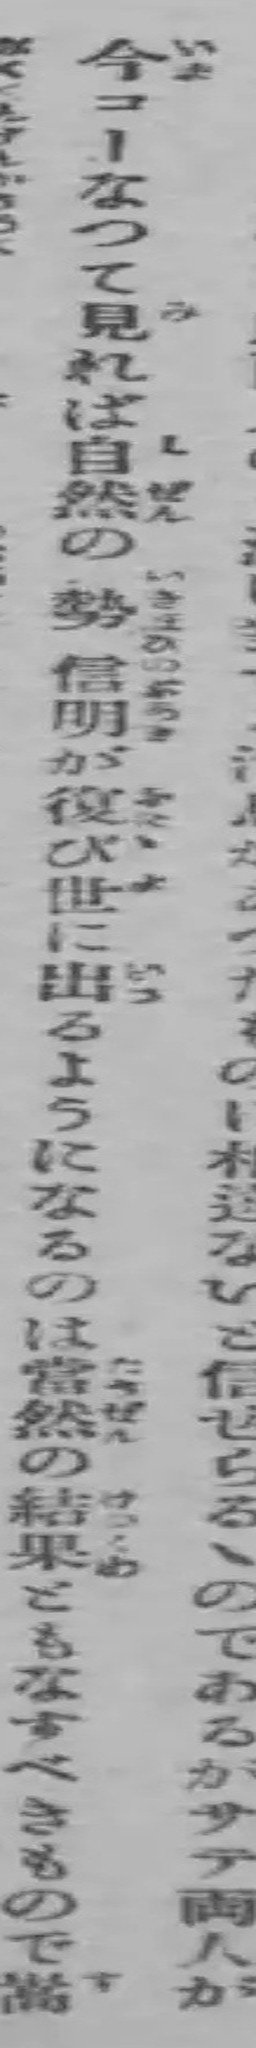今コーなつて見れば自然の勢信明が復び世に出るようになるのは当然の結果ともなすべすべきもので嵩
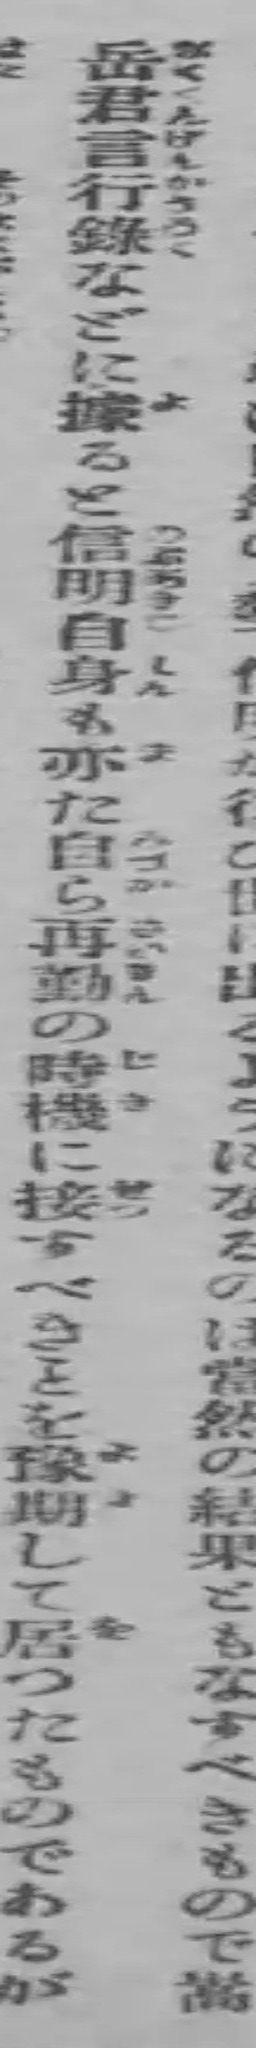信明の復職岳君言行録などに拠ると信明自身も亦た自ら再勤の時機に接すべきことを予期して居つたものであるが
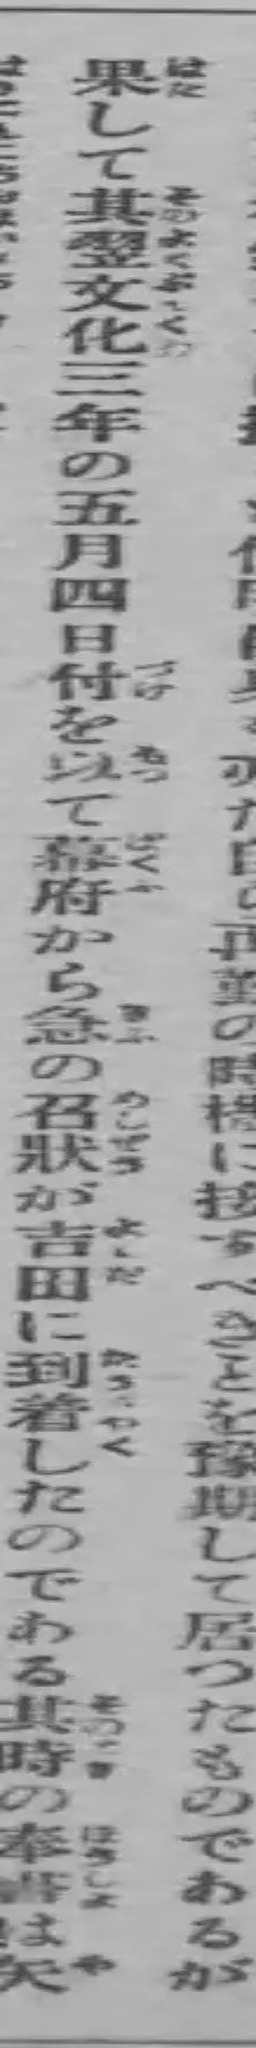果して其翌文化三年の五月四日付を以て幕府から急の召状が吉田に到着したのである其時の奉書は矢
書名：豊橋市史談
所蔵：国立国会図書館 National Diet Library, JAPAN
